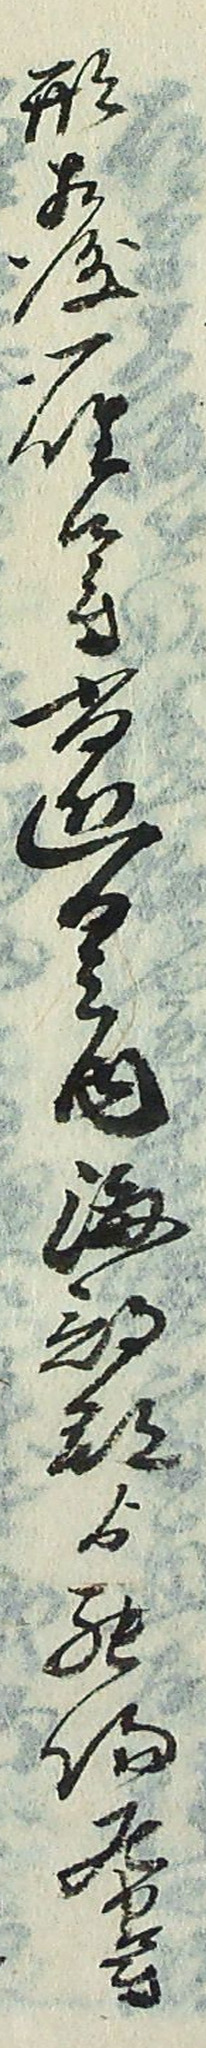形相渡御座候ニ付尚近日之内海部郡ゟ罷帰居申ニ付
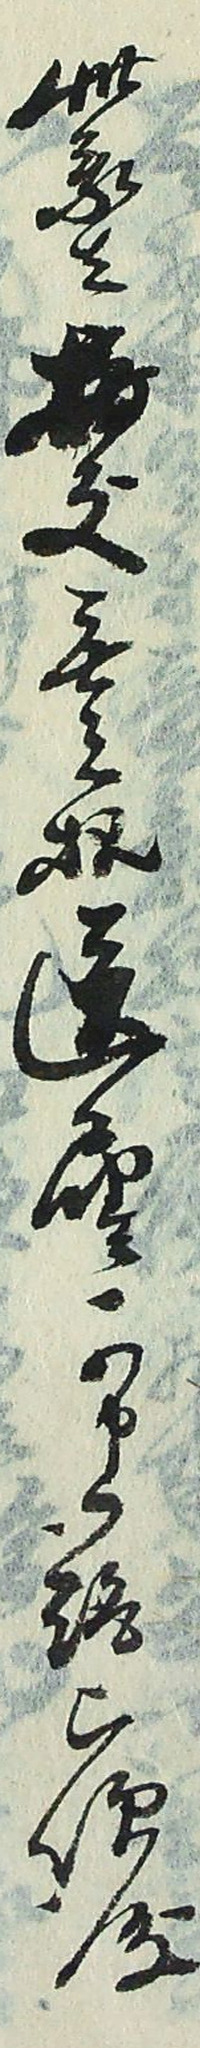此義者指支無之様送届ヶ可申御趣被仰渡
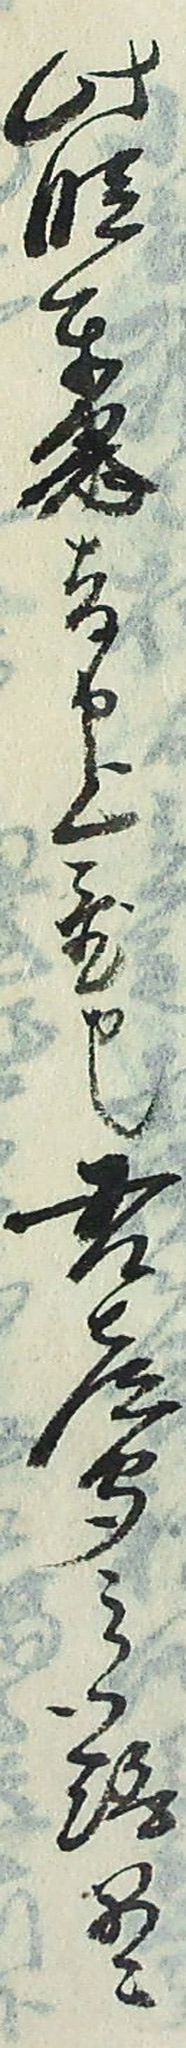此段奉畏旨申上置申候右被仰聞之御趣早々
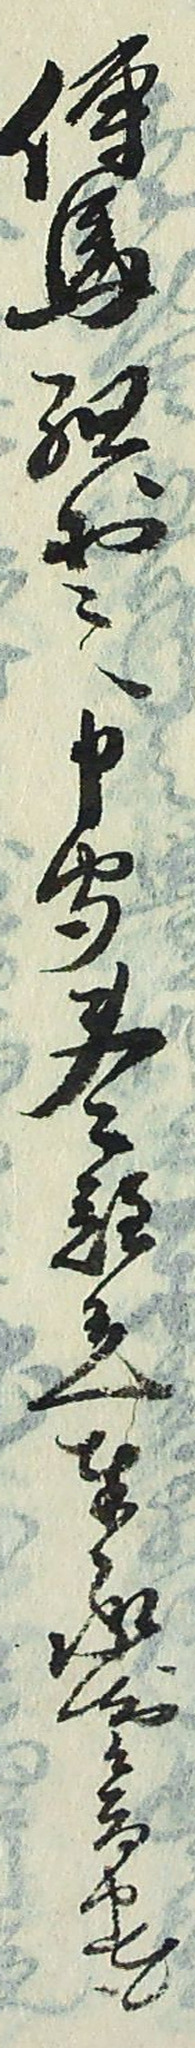傳馬組村々へ申聞夫々難有奉承知候旨申出候
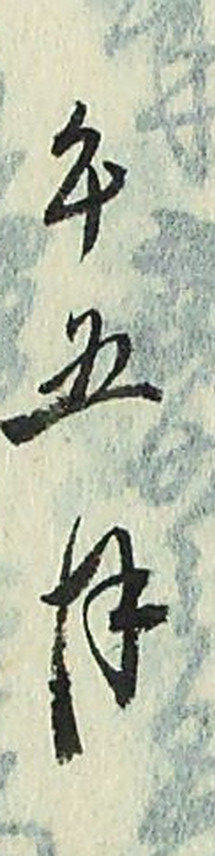午五月
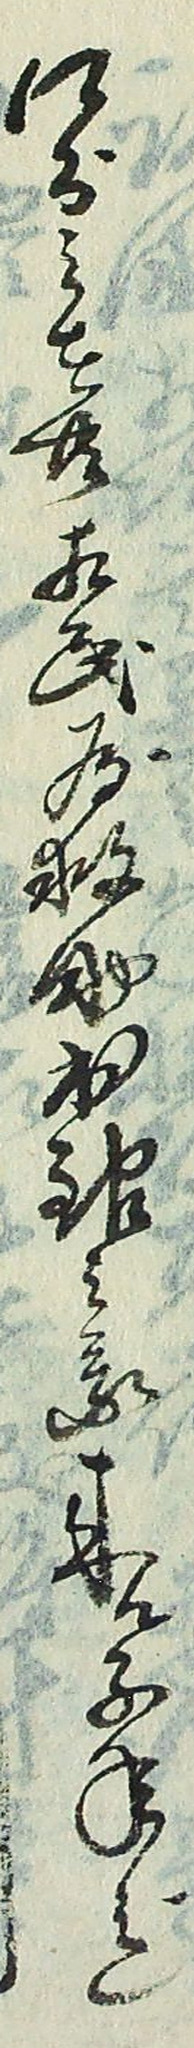郷分之者共相當為救助出銀之義来ル子年迄
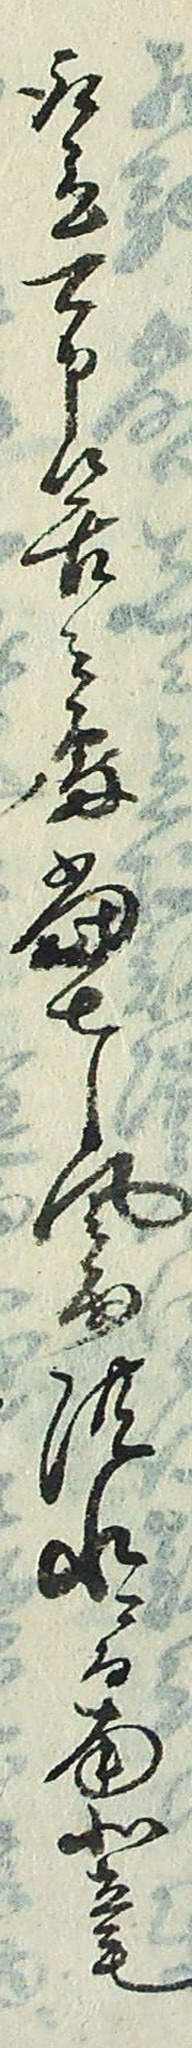取立可申候筈之處當七月風雨洪水ニ而南北立毛
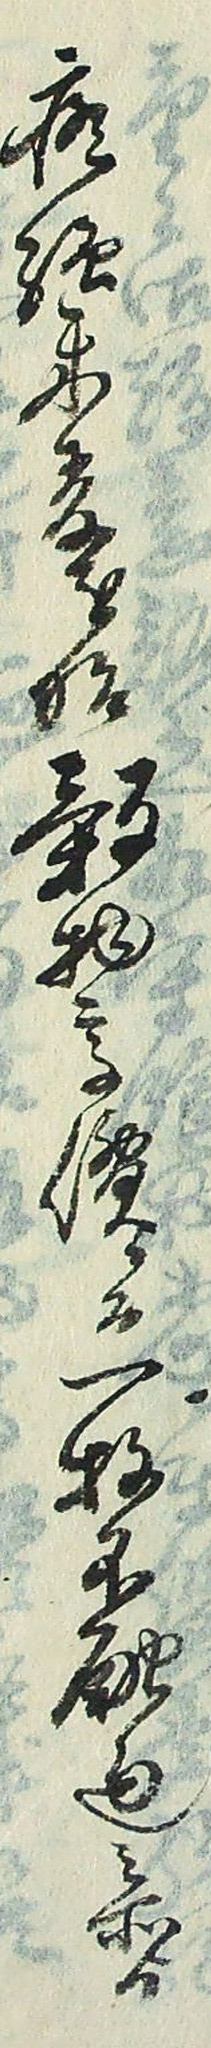疼強米麦を始穀物高價ニ而一牧不融通之所ゟ
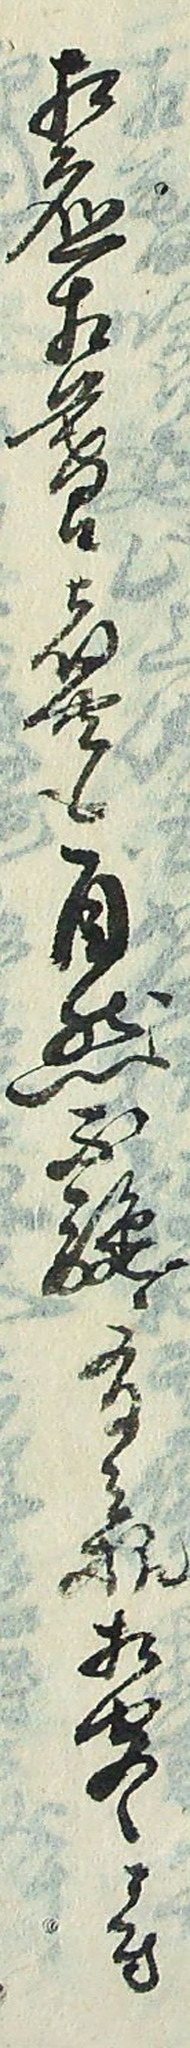相應相暮候者共も自然不旋ニ有之様相聞候ニ付
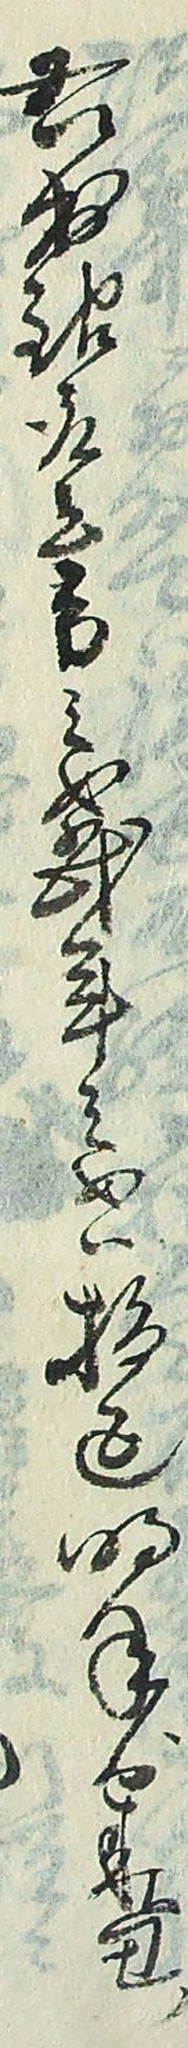右出銀取立方之義當年之義ハ指延明年ゟ来ル丑ノ
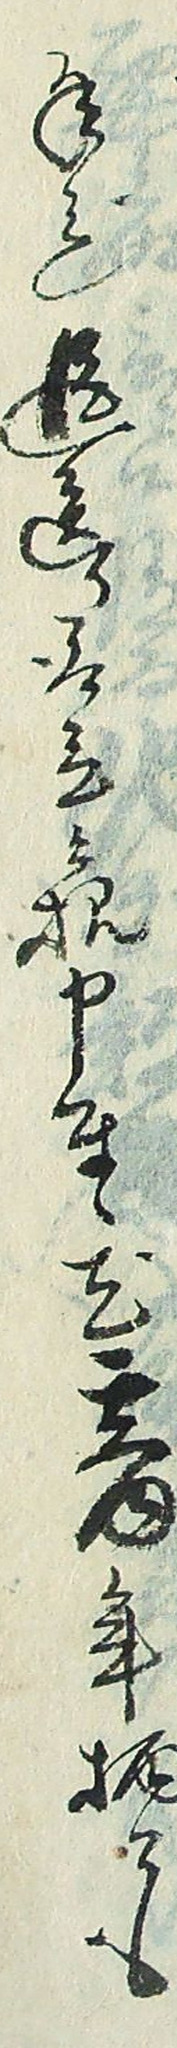年迄追送り取立候様申付候尤其内年柄ニも

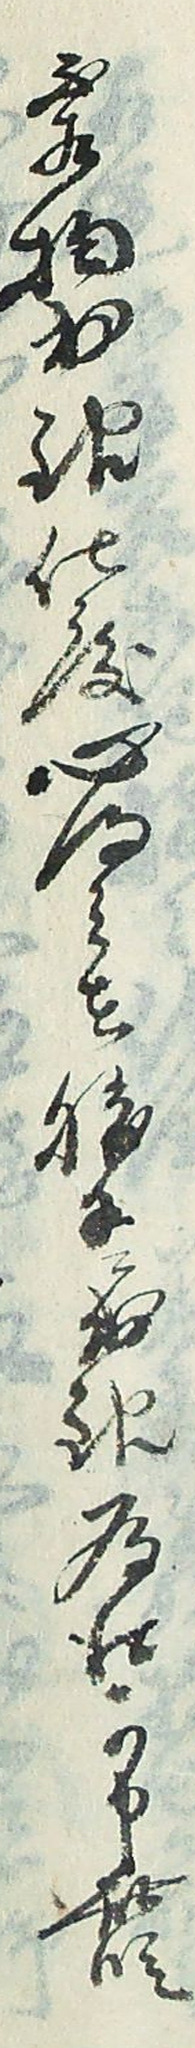不相拘出銀仕度心得之者勝手ニ出銀為仕可申此段
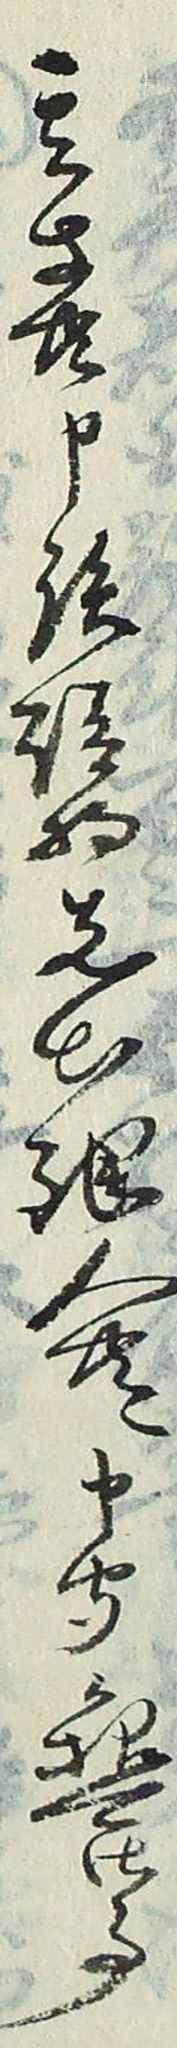其方共申談請持先出銀人共へ申聞候様可仕事
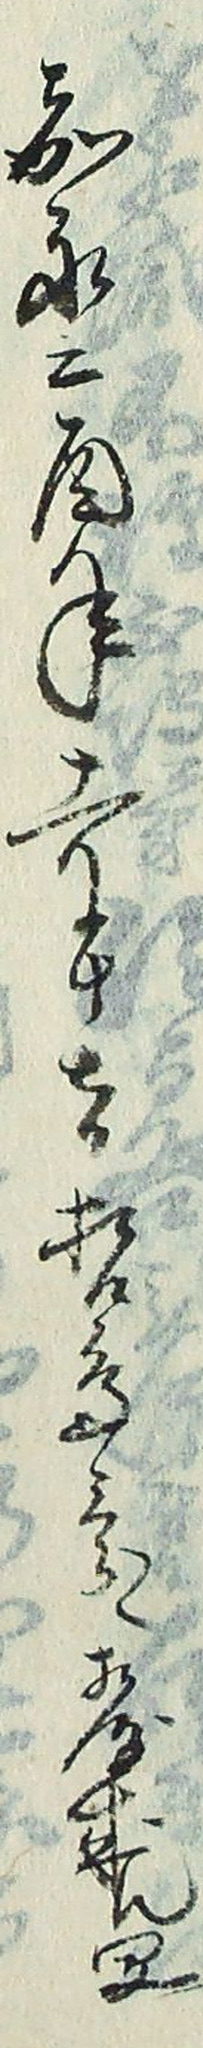嘉永二酉年十一月十七日松江島三郎へ相渡成ル写
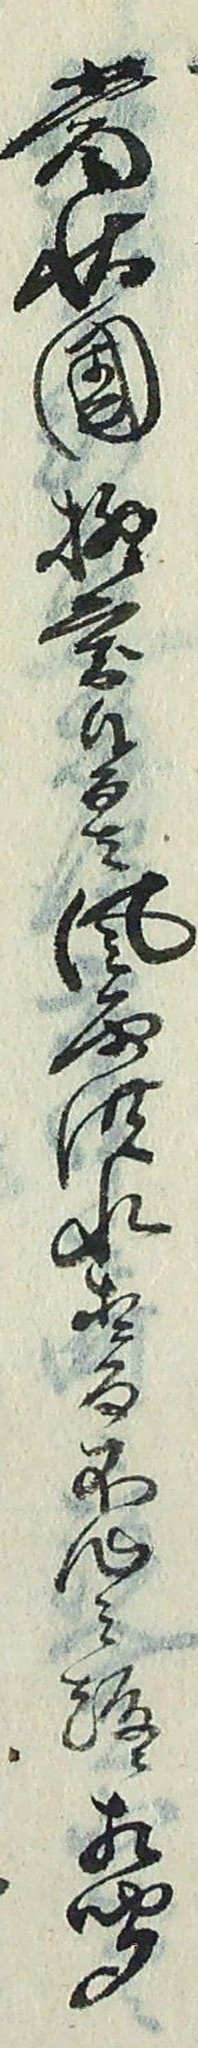當秋國柄ニ寄候而者風雨洪水等ニ而不作之趣ニ相聞
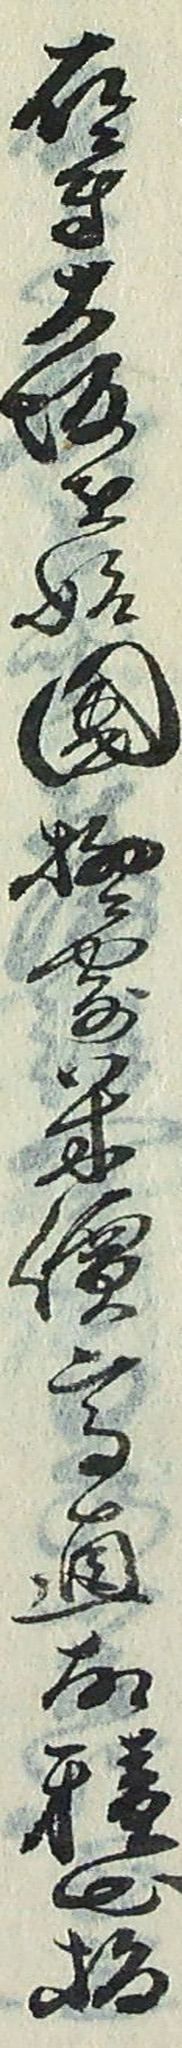右ニ付大坂を始國柄ニ寄米價高直故積出指
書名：諸御趣意書并御下知向之写
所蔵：鳴門教育大学 Naruto University of Education
